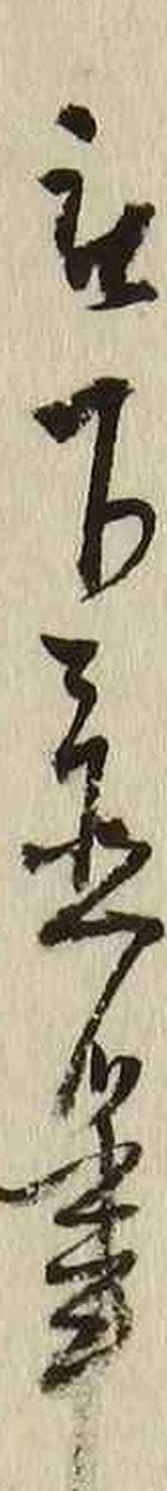被下置候事
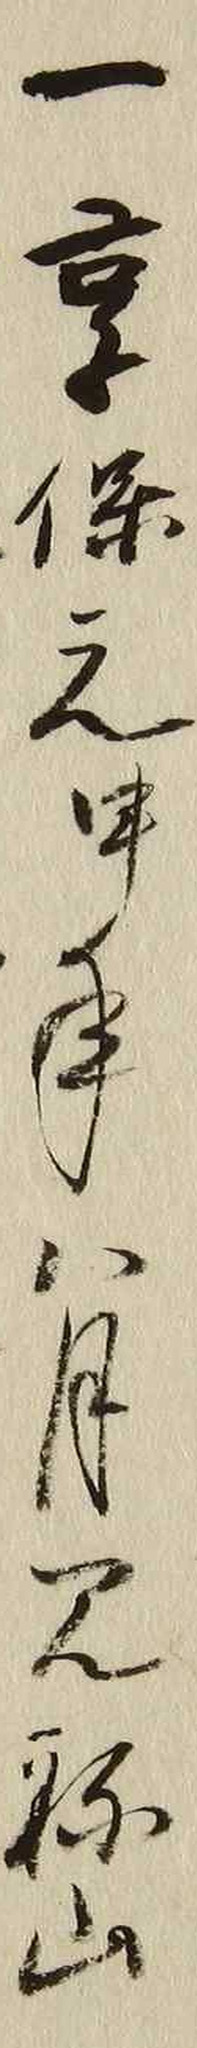一享保元申年八月見禰山
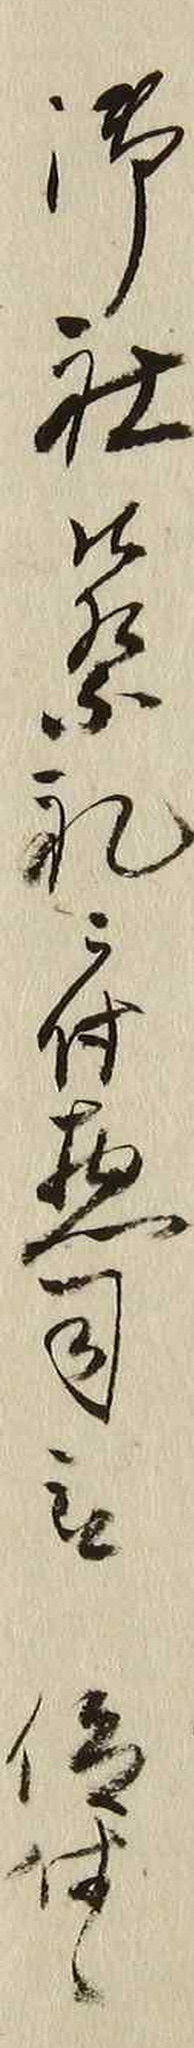御社御祭礼ニ付惣司被仰付候
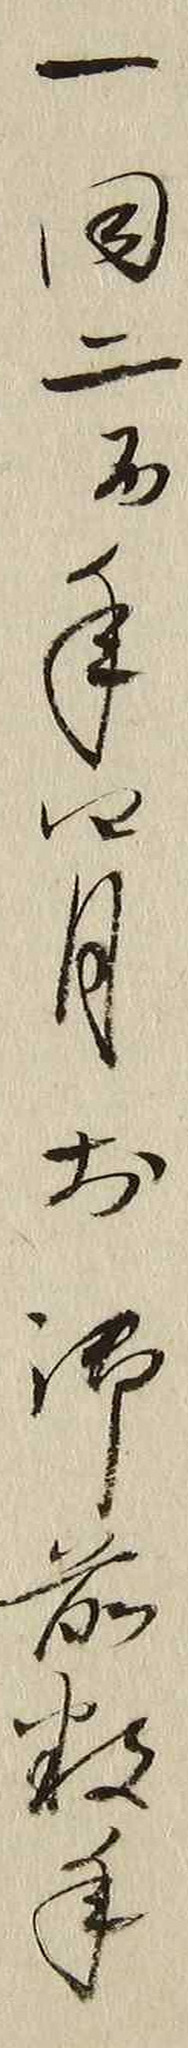一同二酉年四月於前御数年
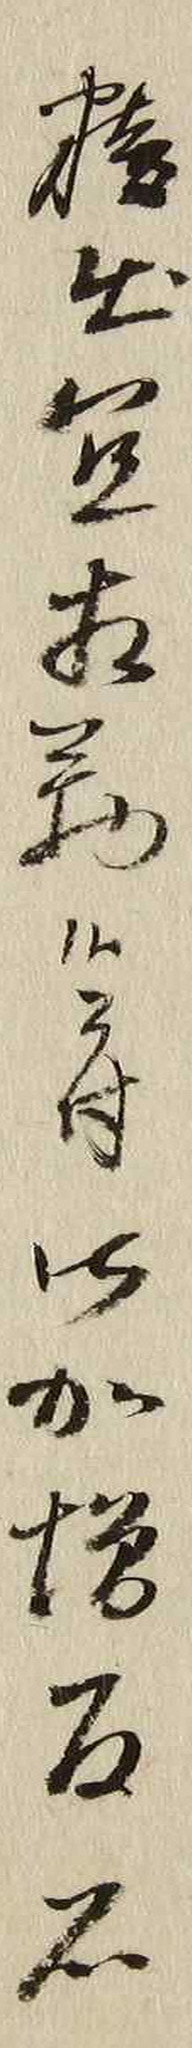精出宜相勤候ニ付御加増百石
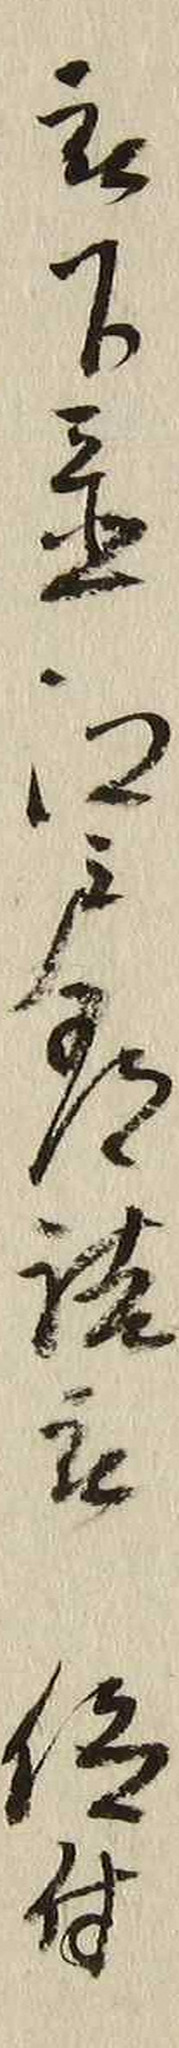被下置江戸常詰被仰付
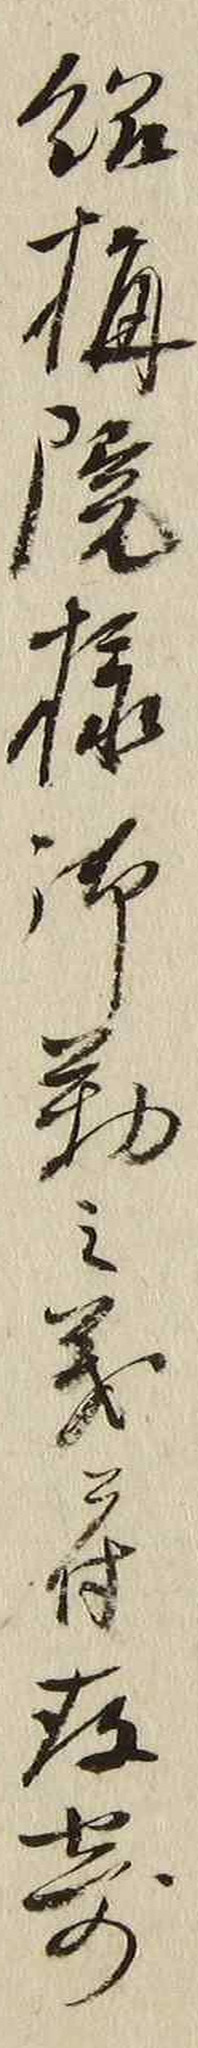紹栴院様御勤之義ニ付存寄
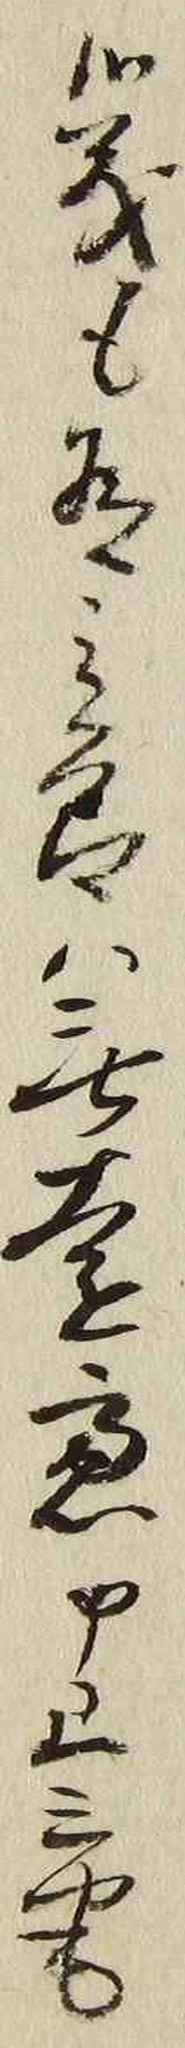候義も有之節ハ無遠慮申上三宅
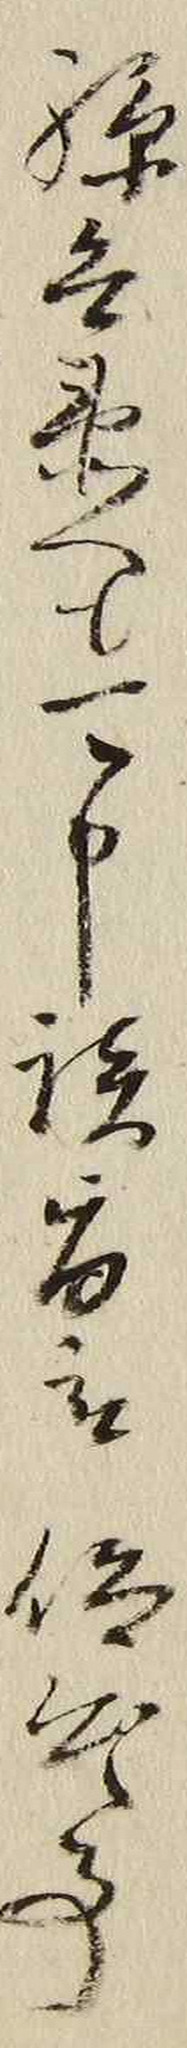孫兵衛へも可申談旨被仰出候事
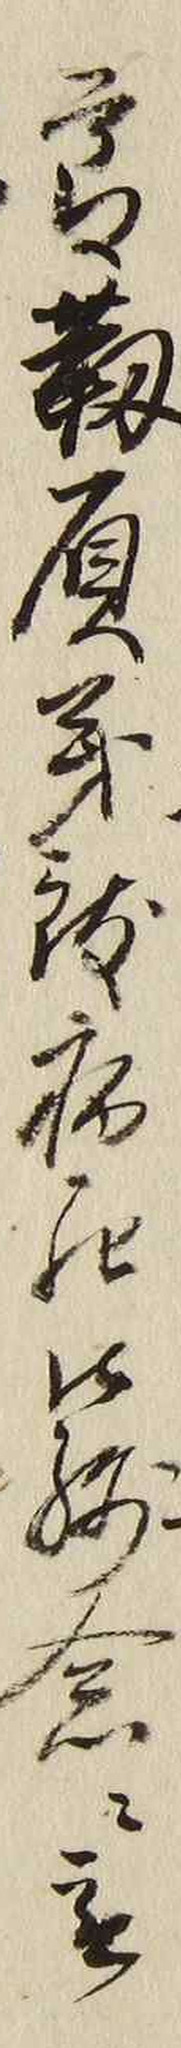節靱負義致病死仕残念ニ被
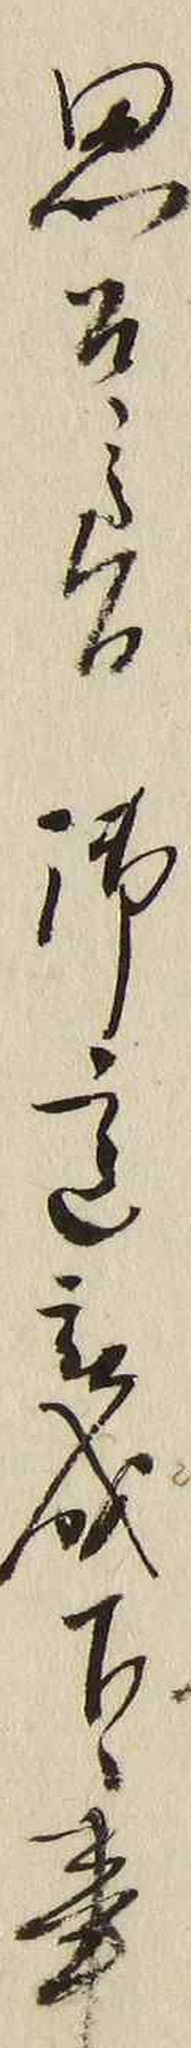思召之旨御意被成下候事

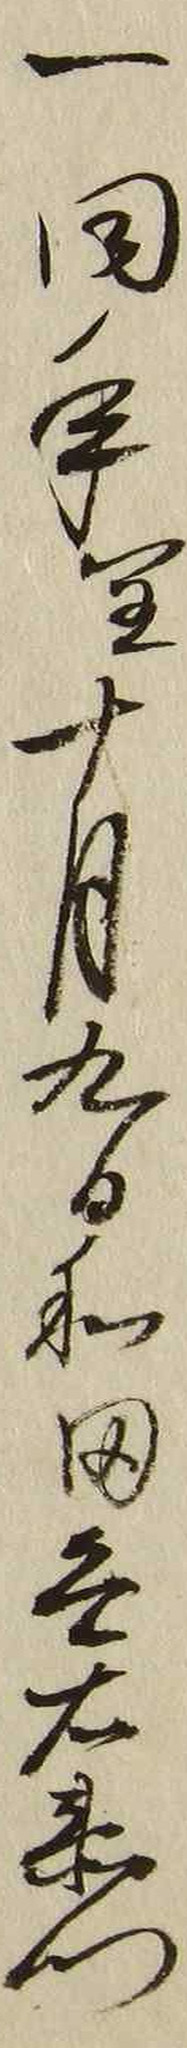一同年閏十月九日和田兵右衛門
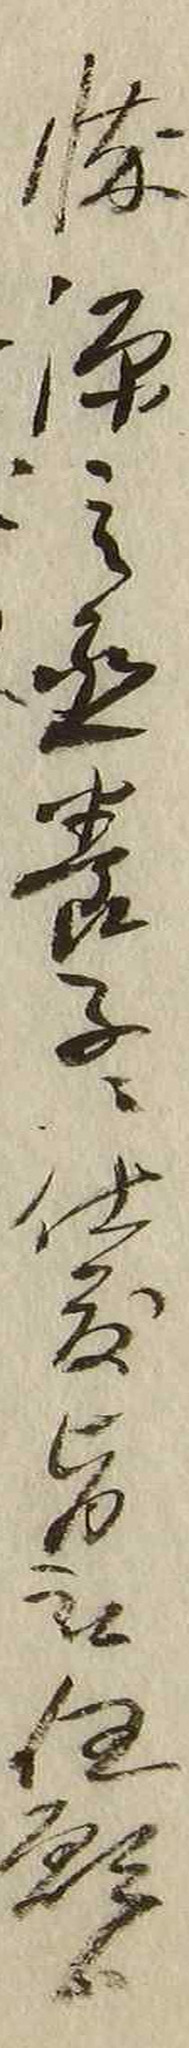忰源之丞養子ニ仕度旨被任願候
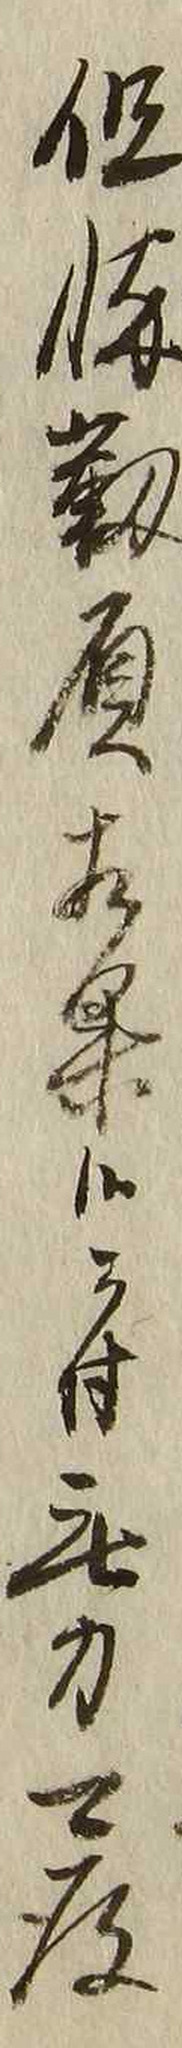但忰靱負相果候ニ付無力可存
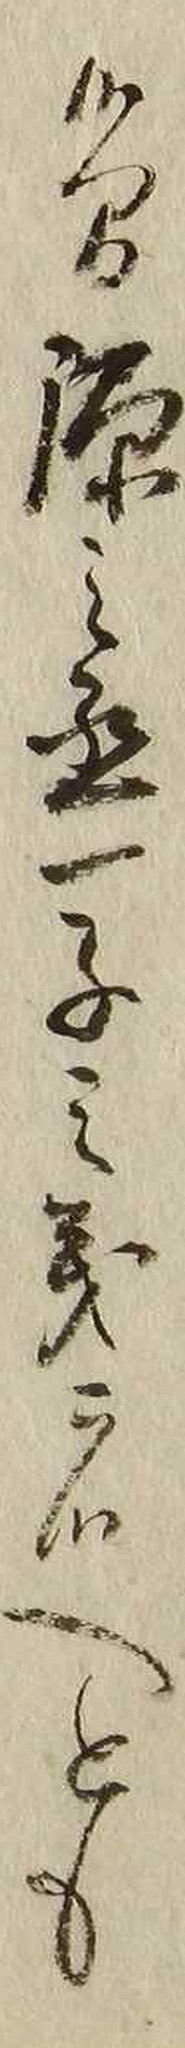候間源之丞一子之義ニ候へとも
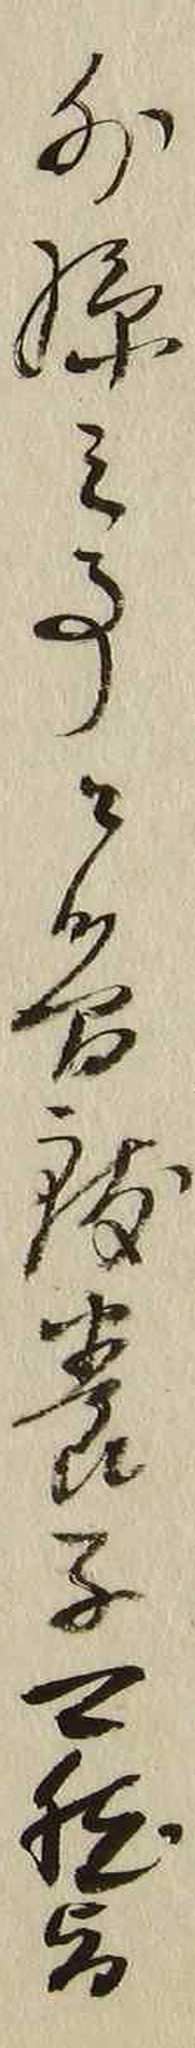外孫之事ニ候間致養子可然旨
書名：諸士系譜　巻之351　す之部1
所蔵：会津若松市立会津図書館
